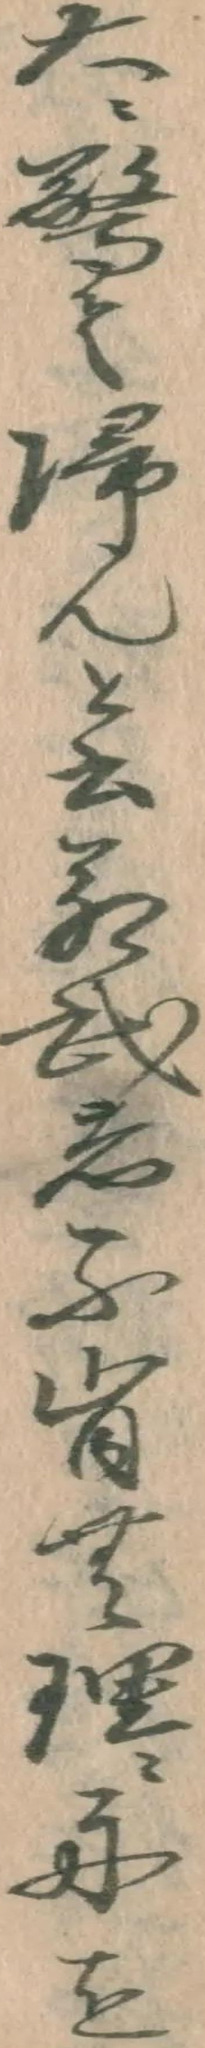大に驚て帰んと云若武者不肯無理に舟を
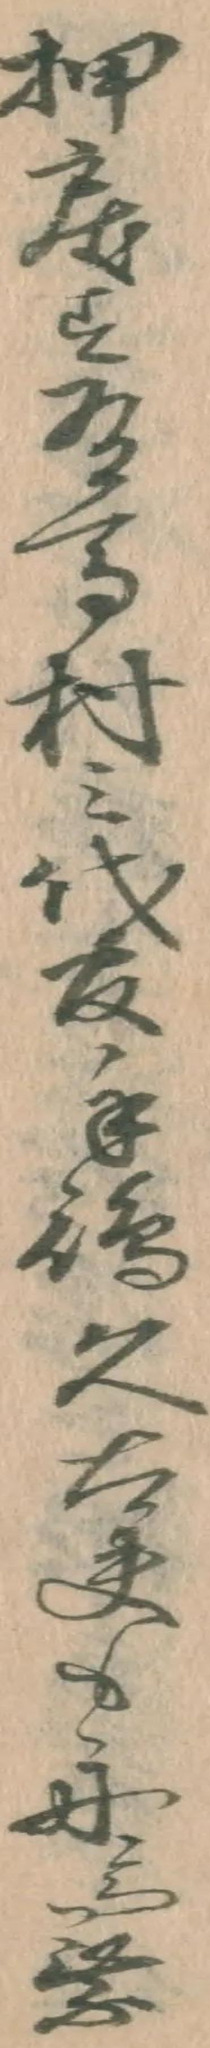押戻す有馬村之代官手島久太夫も舟に而乗
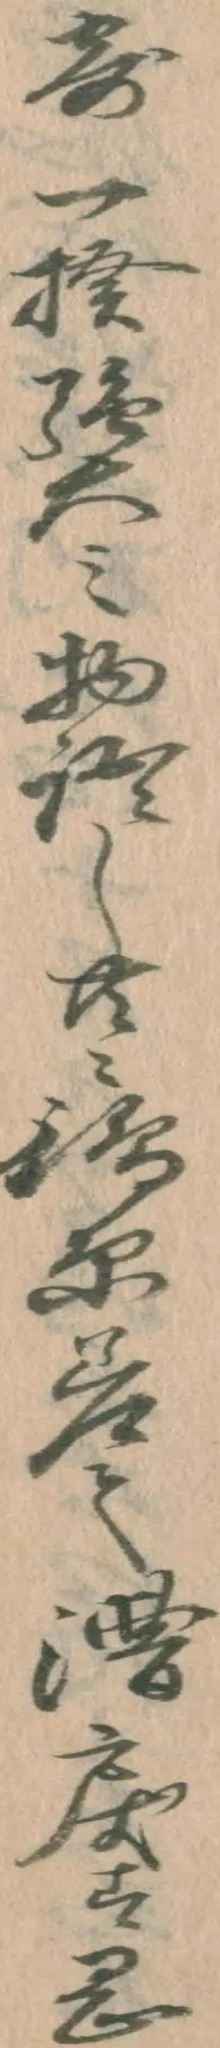寄一揆強大之物語し共に島原差て漕戻す岡
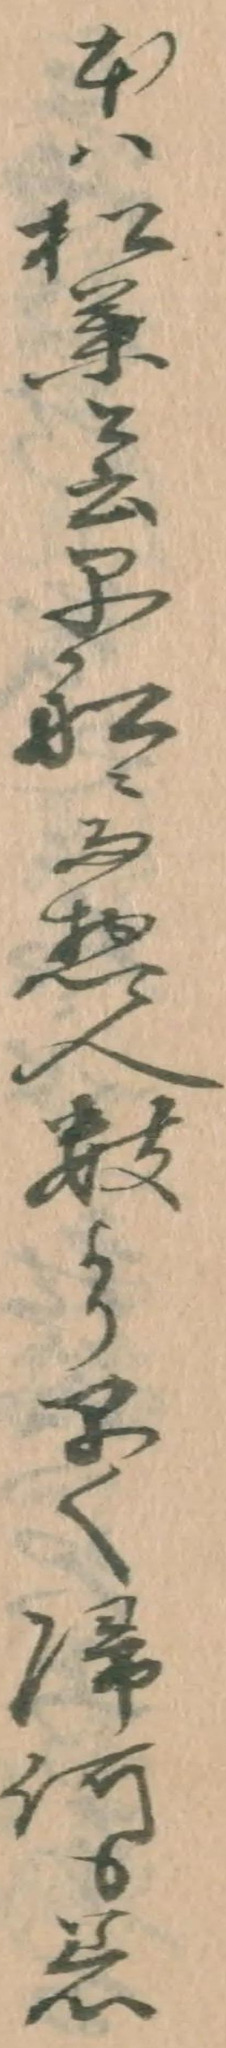本は松葉と云早船に而惣人数より早く帰何も着
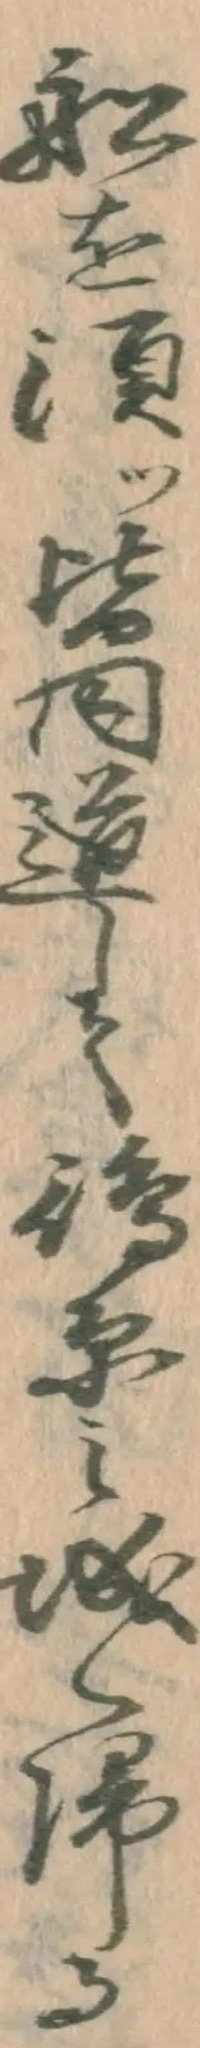船をすつ皆同道して島原之城へ帰る
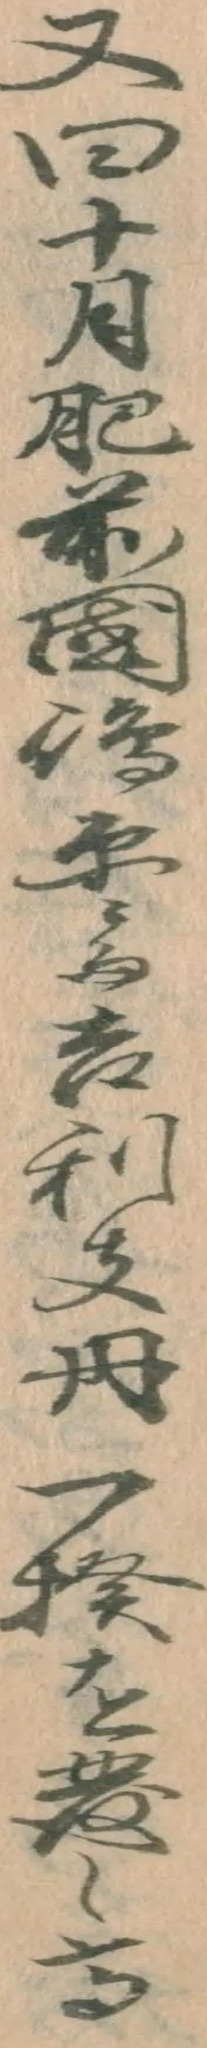又日十月肥前国島原に而吉利支丹一揆を発し高
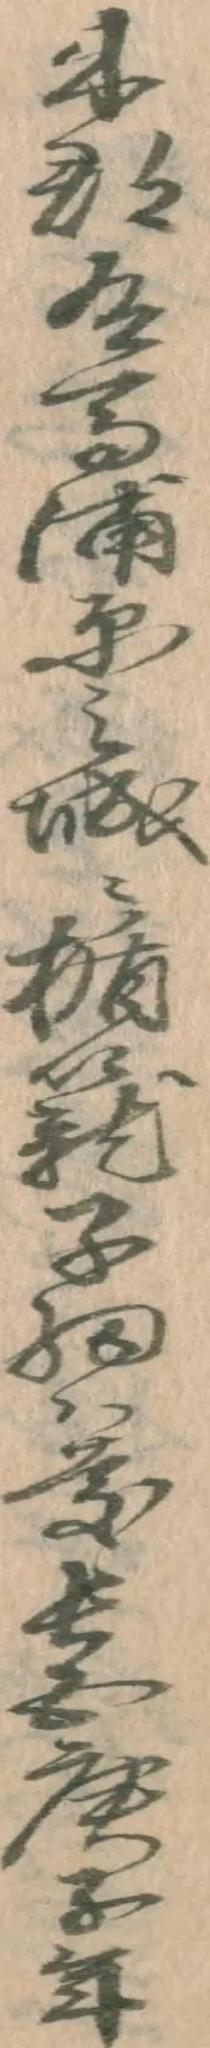来郡有馬浦原之城に楯籠子細は慶長五庚子年
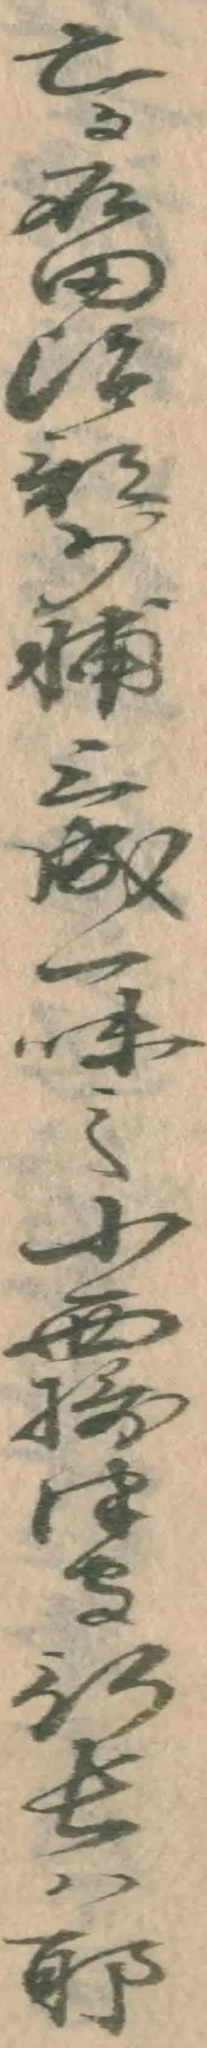亡る石田治部少輔三成一味之小西摂津守行長は耶
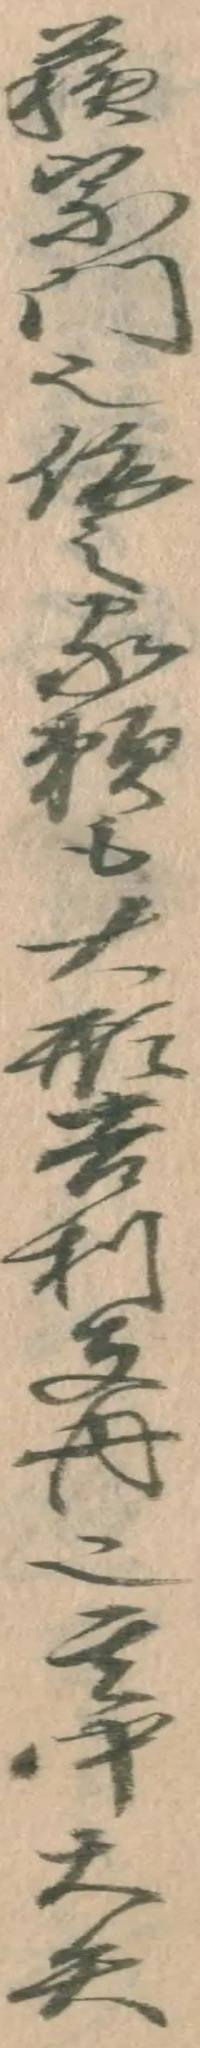蘇宗門也依之家頼も大形吉利支丹也其中大矢
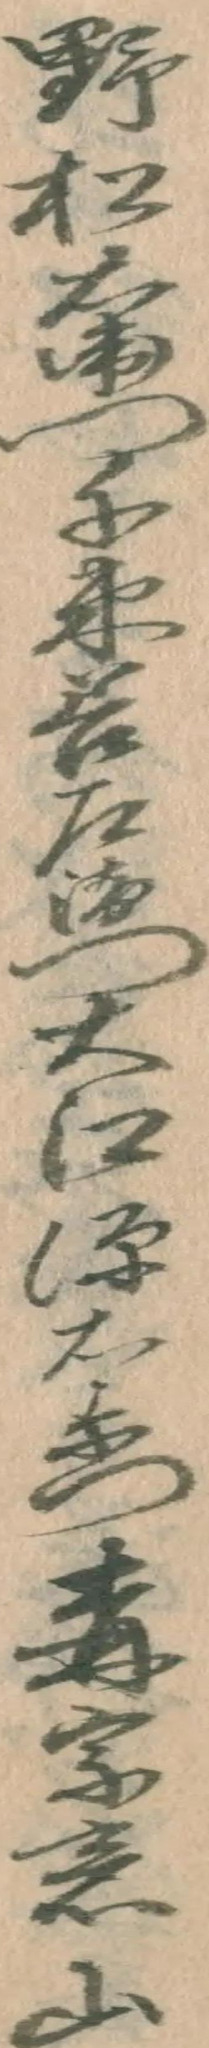野松右衛門千束善左衛門大江源右衛門森宗意山
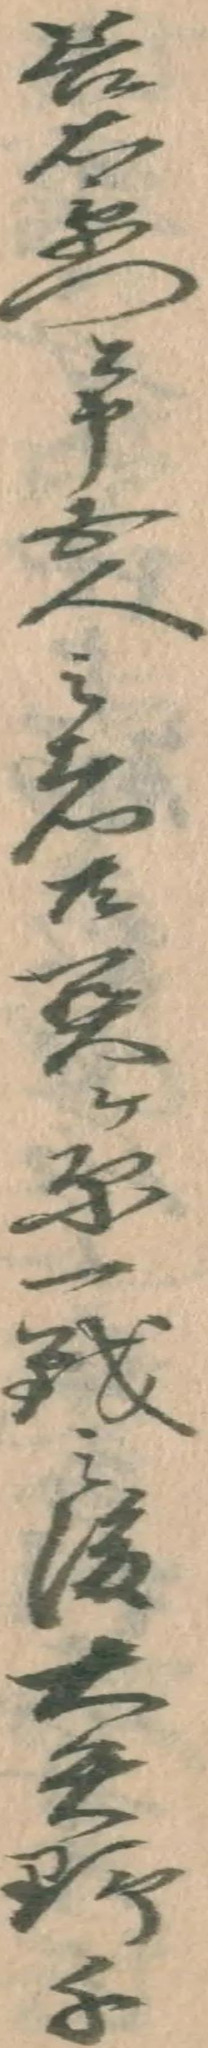善右衛門と申五人之者共関ヶ原一戦之後大矢野千
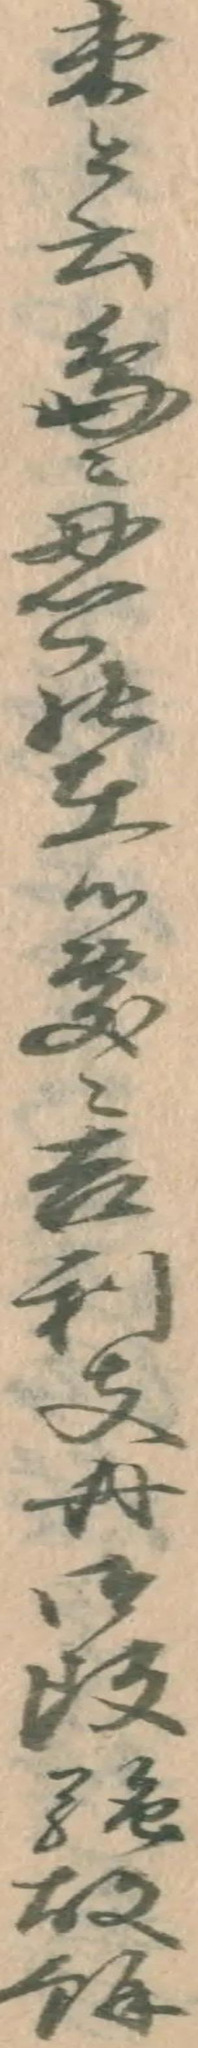束と云島も忍つ能在候処に吉利支丹御改騒故余
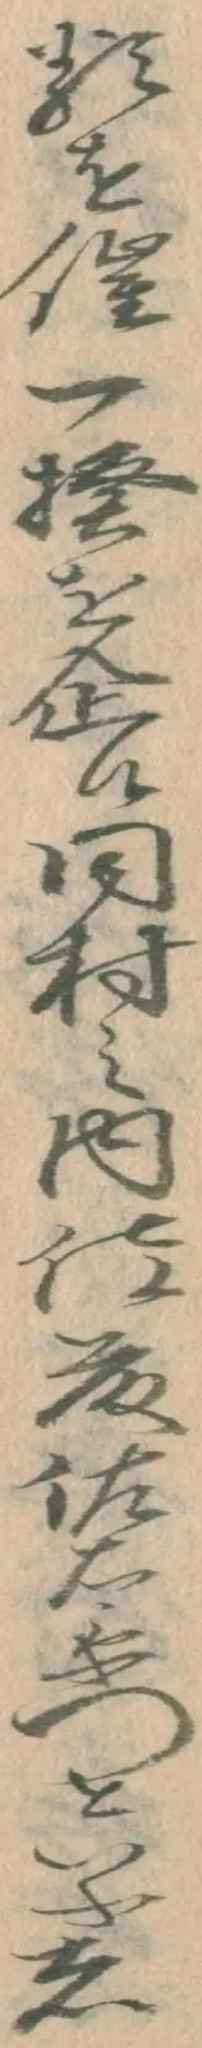類を催一揆を企候同村之内佐藤佐右衛門といふ者

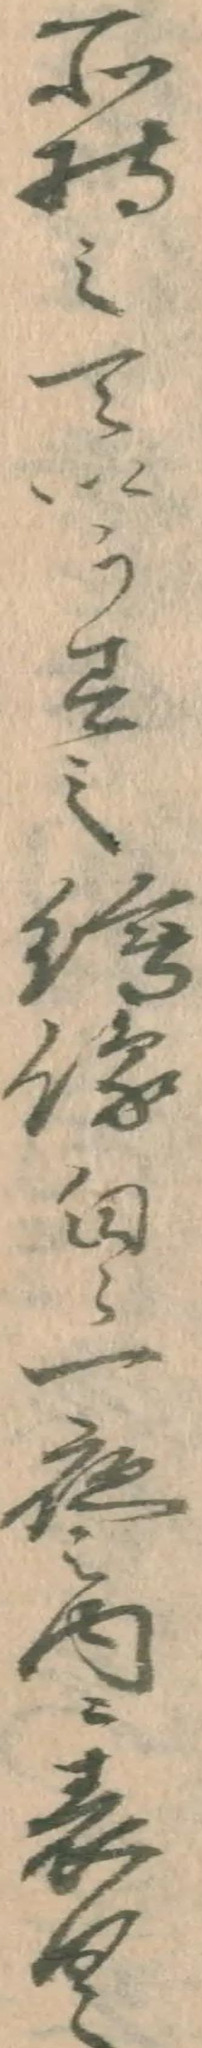所持していうす之絵像自ら一夜之内に表具
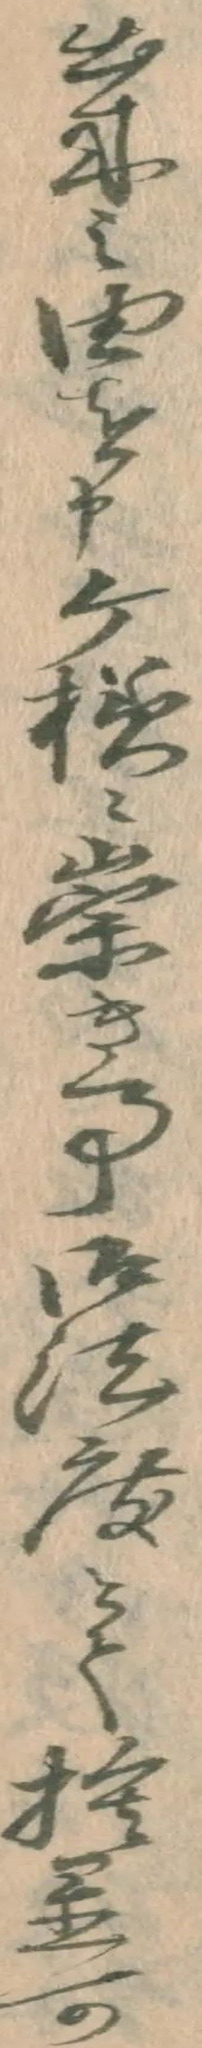出来之由を申ケ様に崇き事御法度とて捨置可
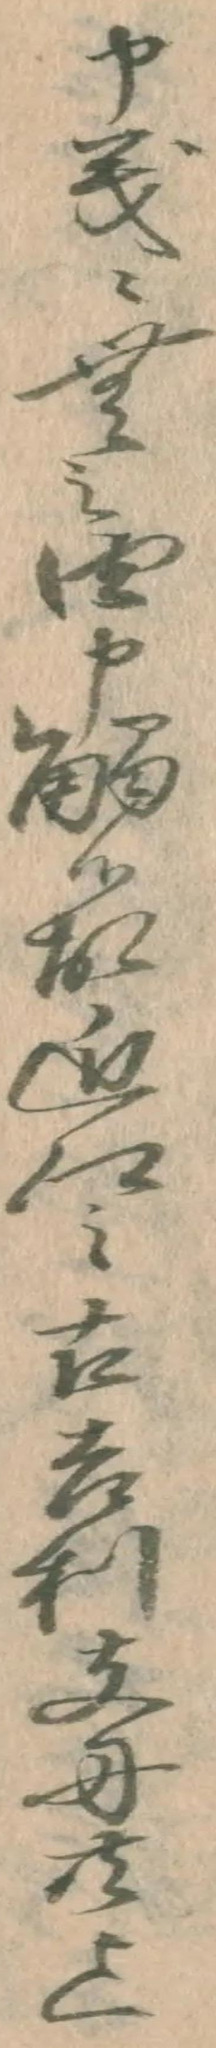申義に無之由触候故近郷之古吉利支丹共迄
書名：切支丹御退治記 49巻. [1]
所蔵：国立国会図書館 National Diet Library, JAPAN
